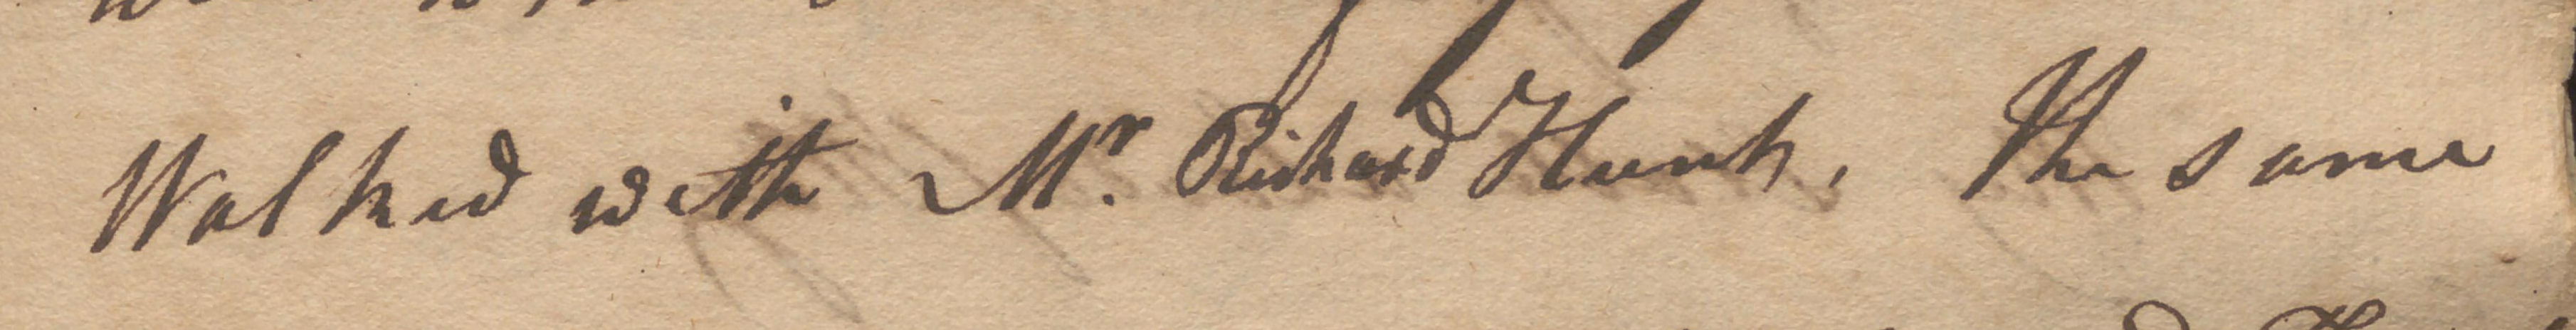Walked with M^r. Richard Hunts, the same
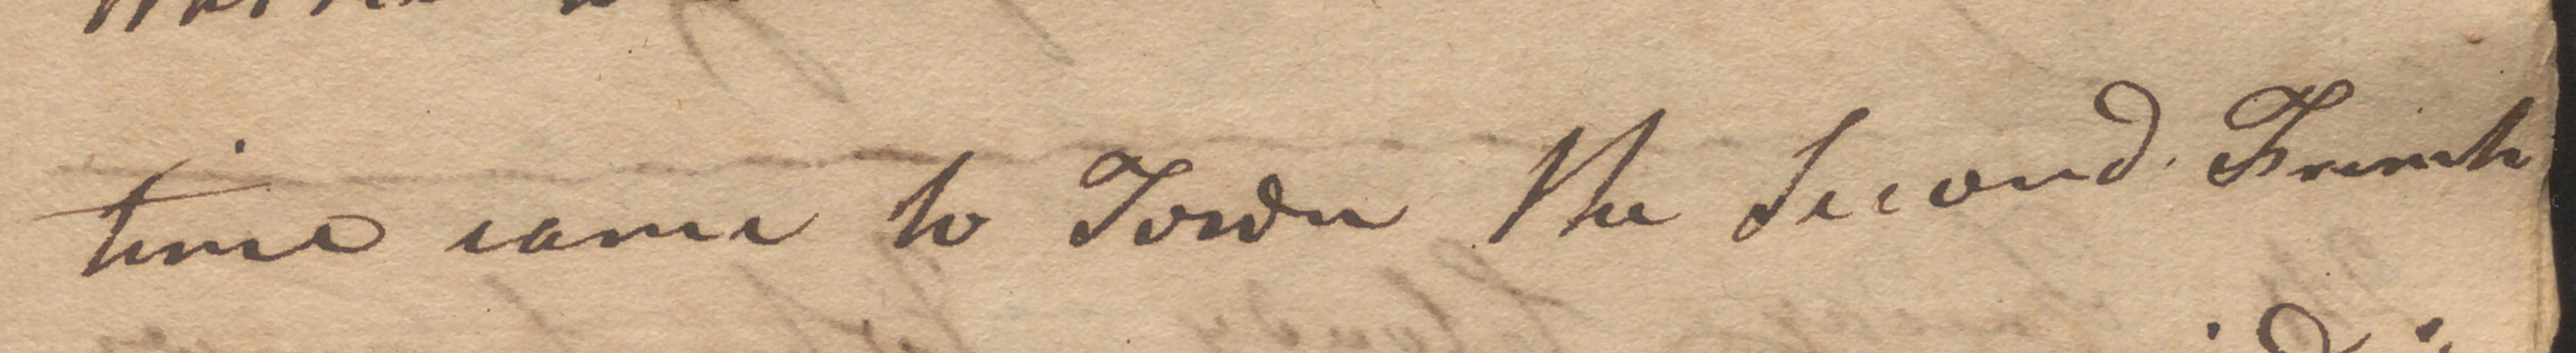time came to Town the second French
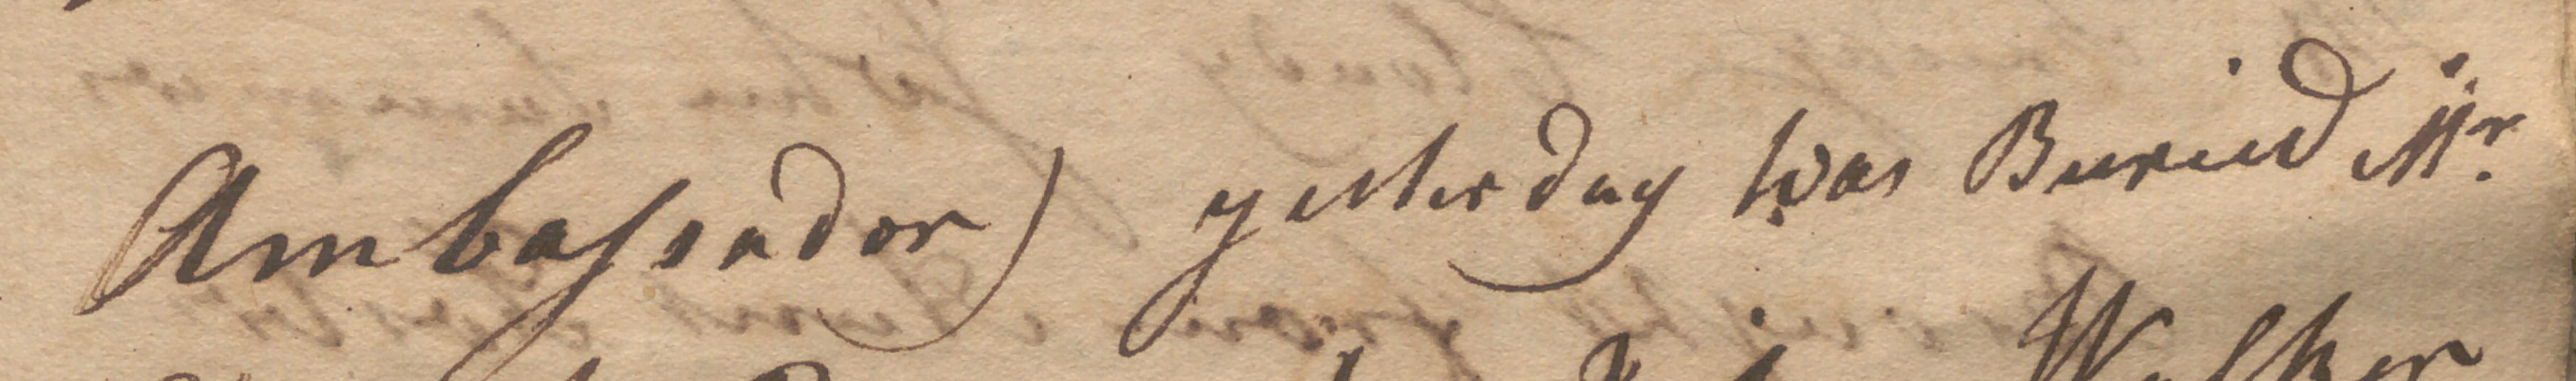Ambassador) yesterday was Buried M^r.
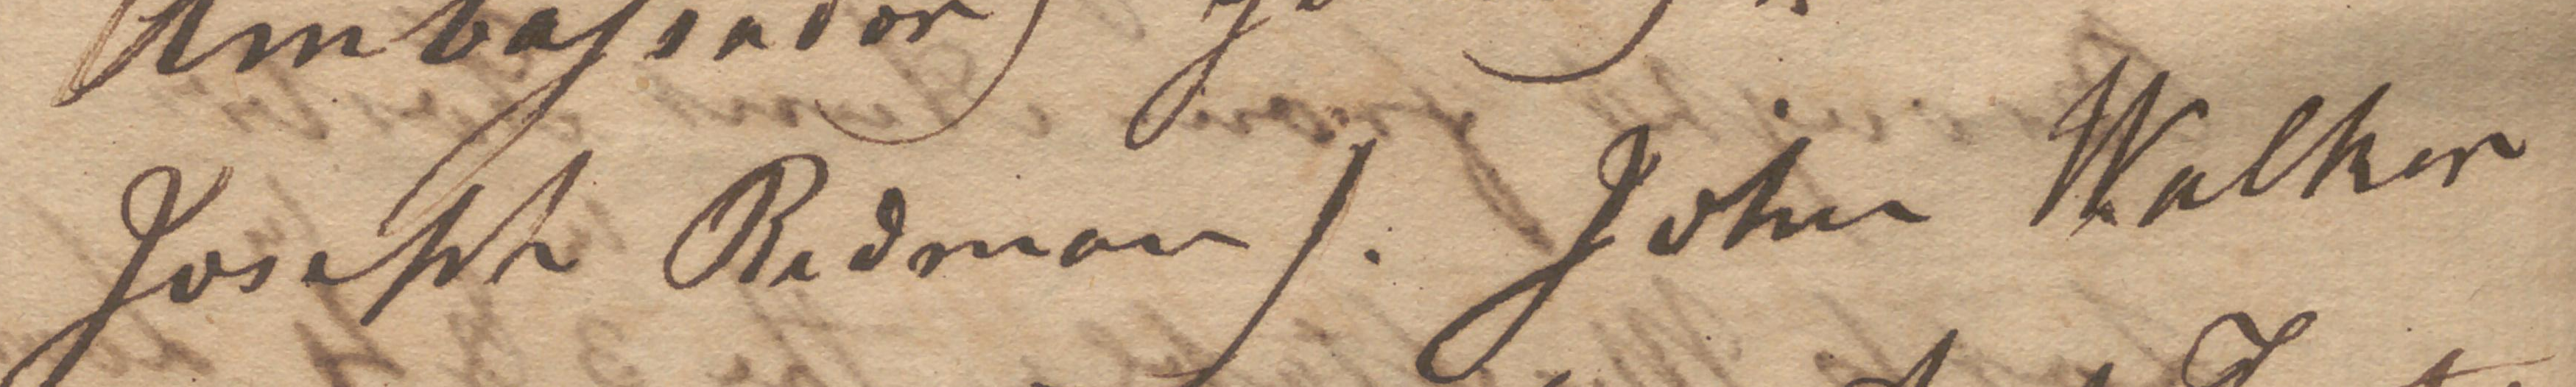Joseph Redman). John Walker
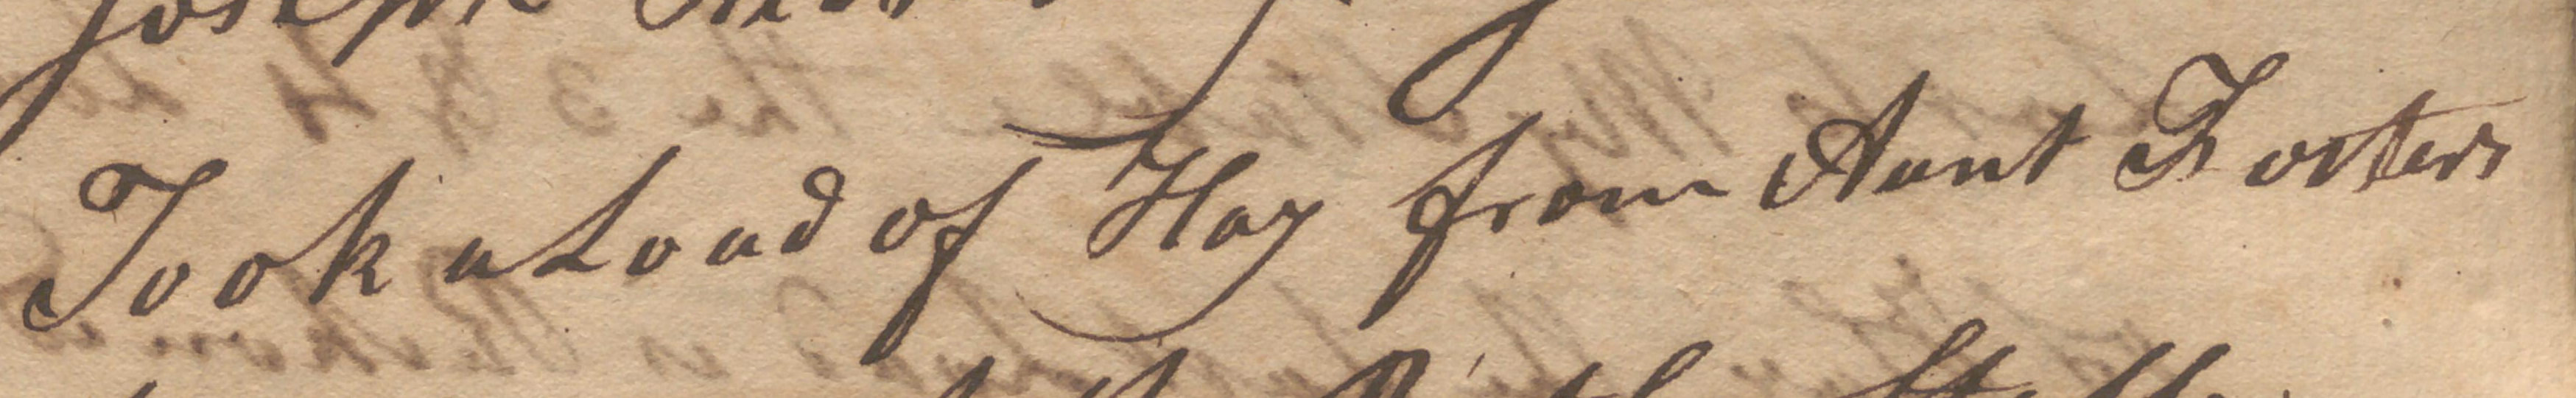Took a Load of Hay from Aunt Fosters
